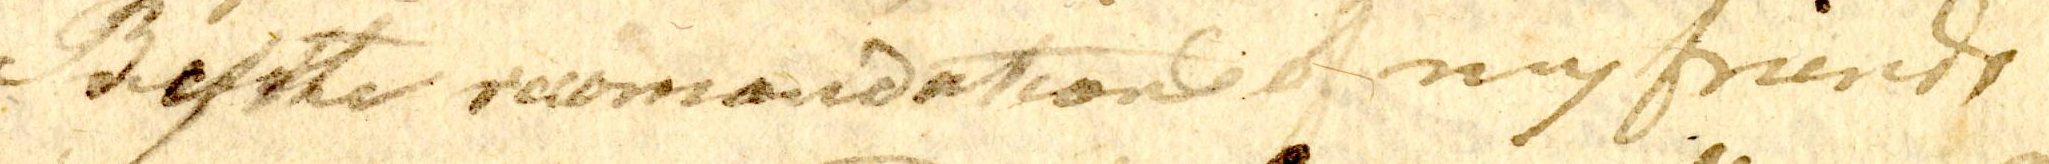By the recomendation of my friends
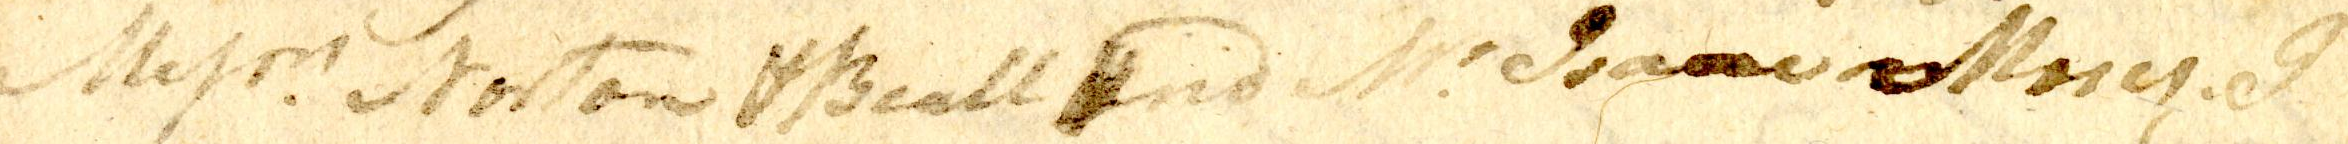Mess^rs. Norton & Beall and M^r. Isaac Moses I
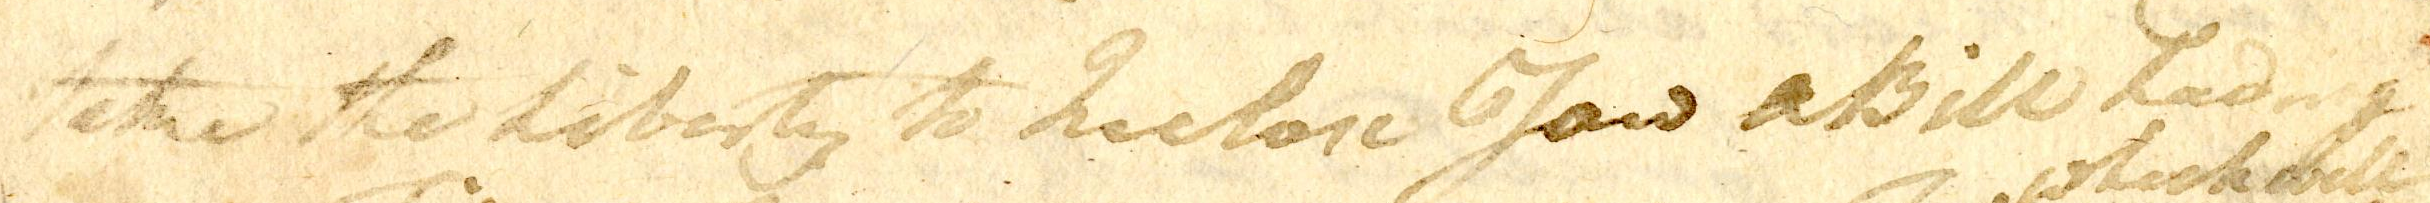take the Liberty to Inclose you a Bill Lading
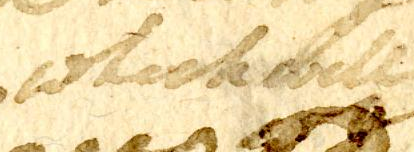which Sale
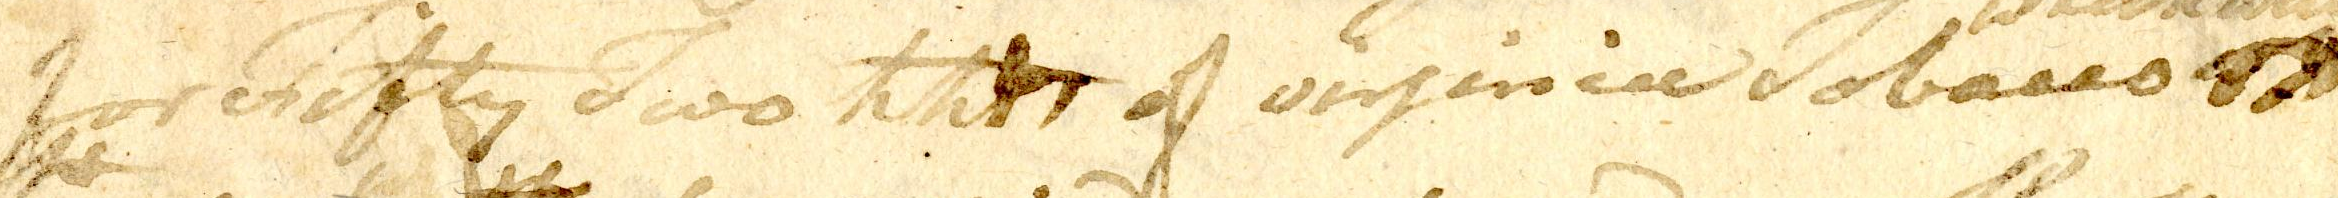for Fifty Two hhd^s of Virginia Tobacco
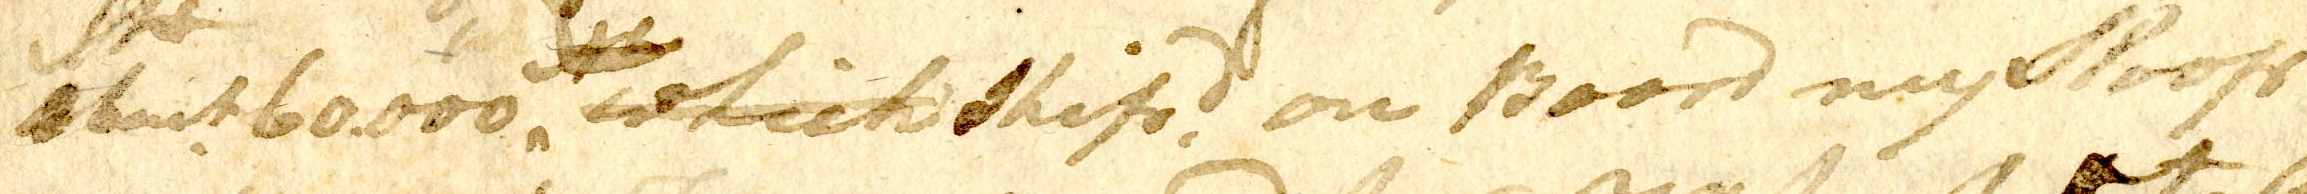about 60.000 ^ which ship^d. on Board my sloops
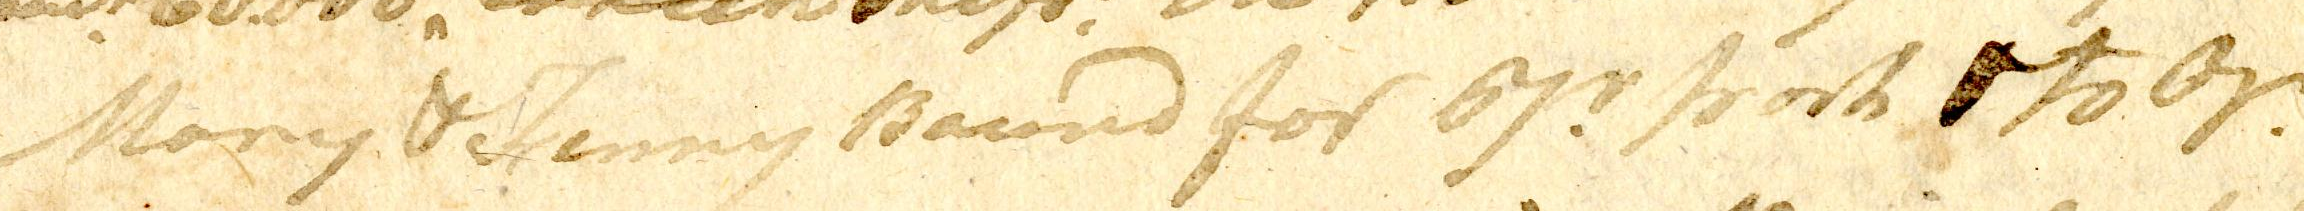Mary & Fanny bound for Y^r port & to y^r.
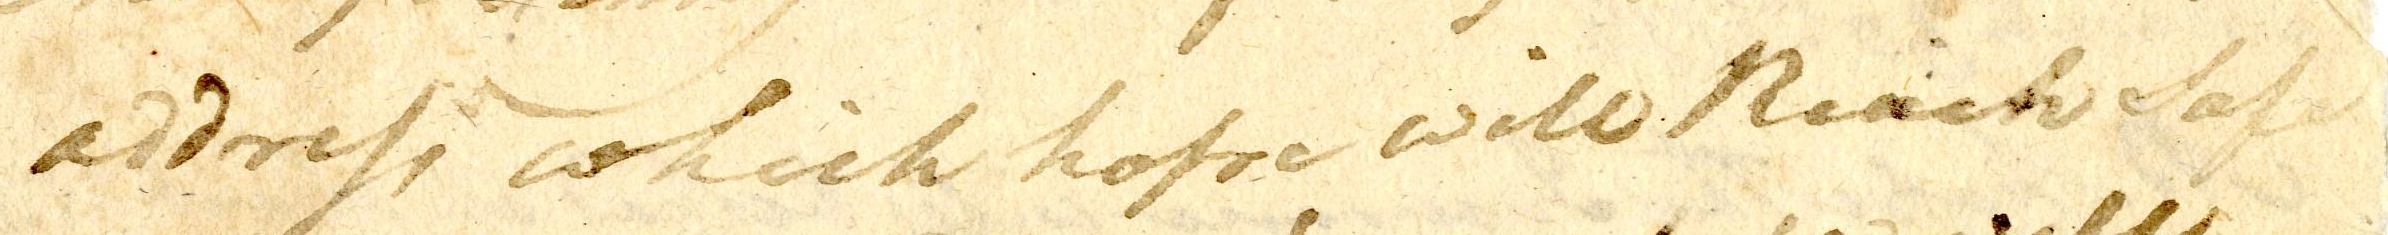address which hope will Reach Safe
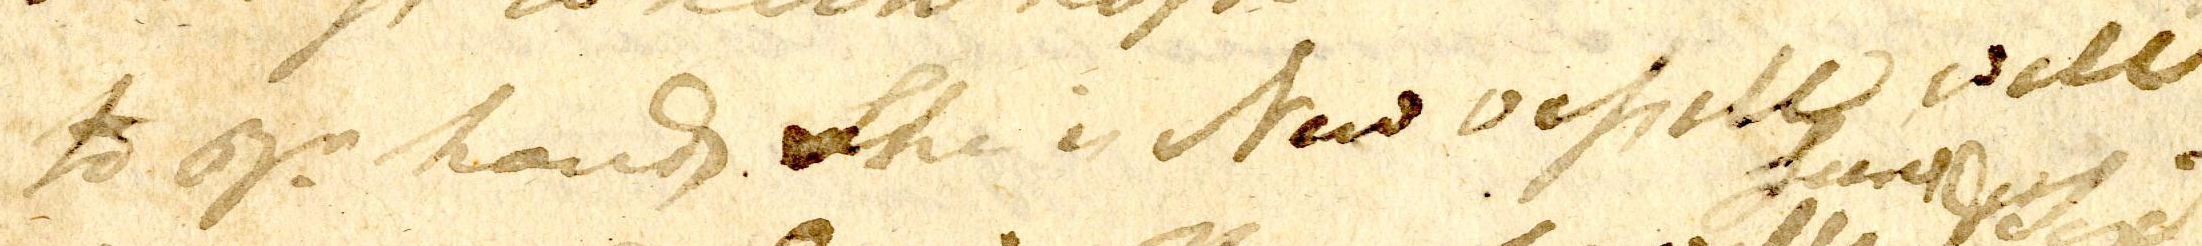to y^r hands She is New vessell well
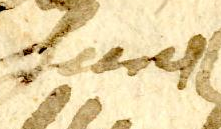sales
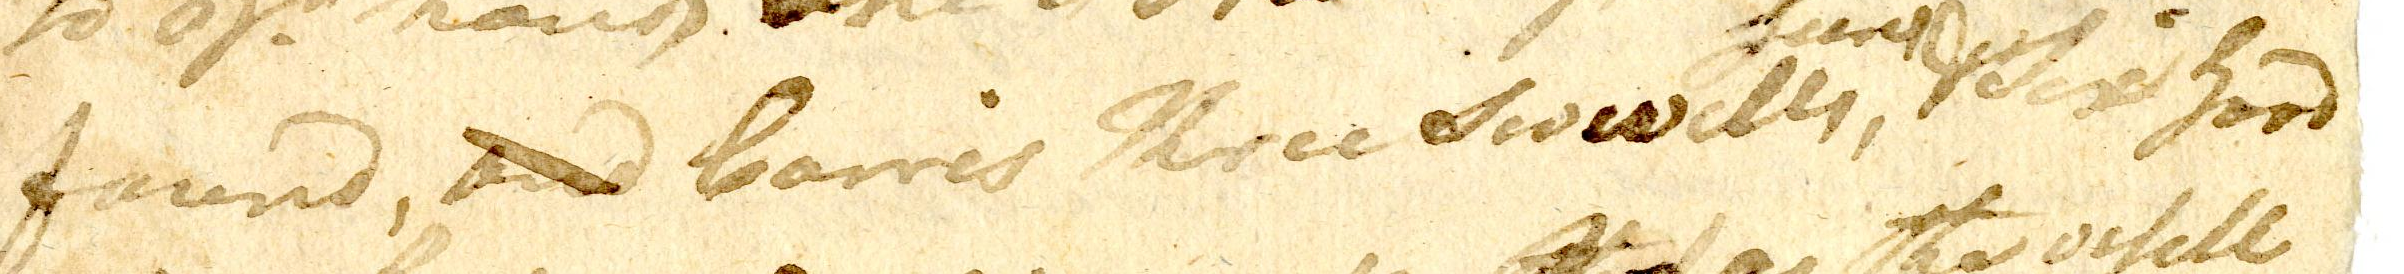found, and Carries Three swwells, & six good
